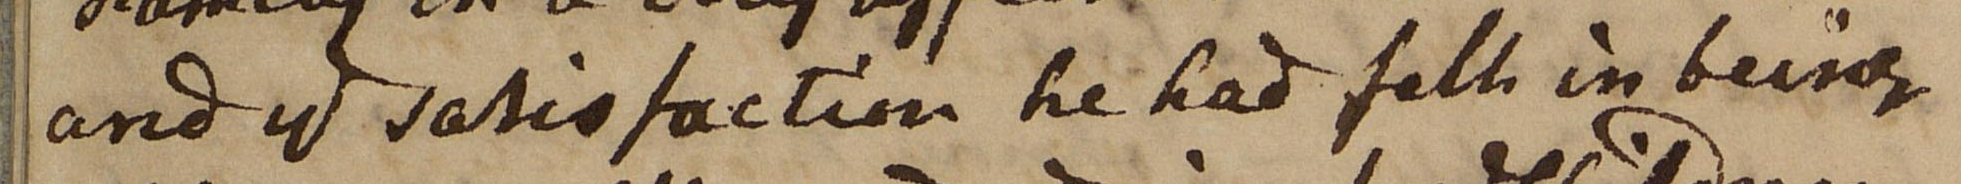and y^e satisfaction he had felt in being
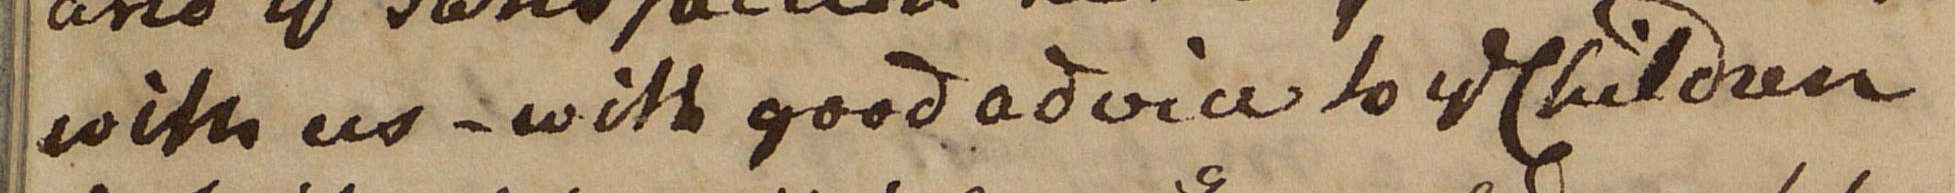with us- with good advice to y^e Children
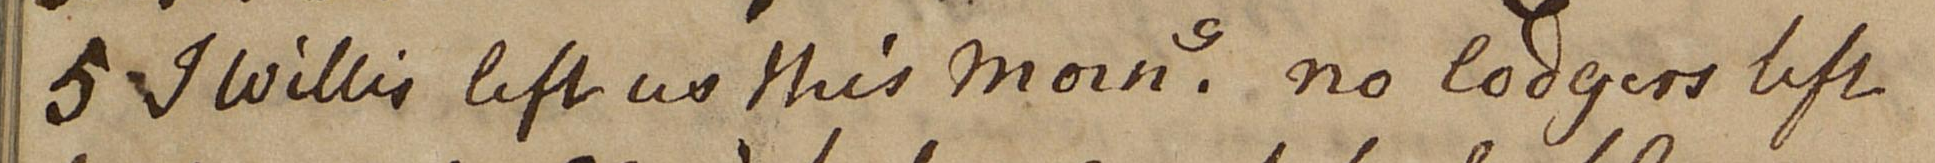5 I Willis left us this morn^g. no lodgers left
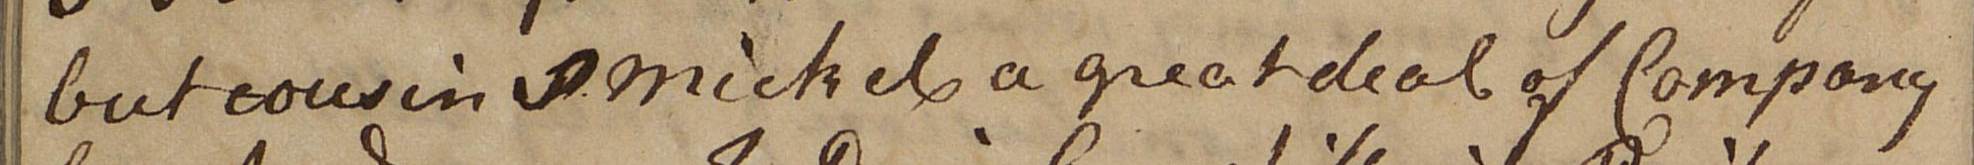but cousin I Mickel a great deal of Company
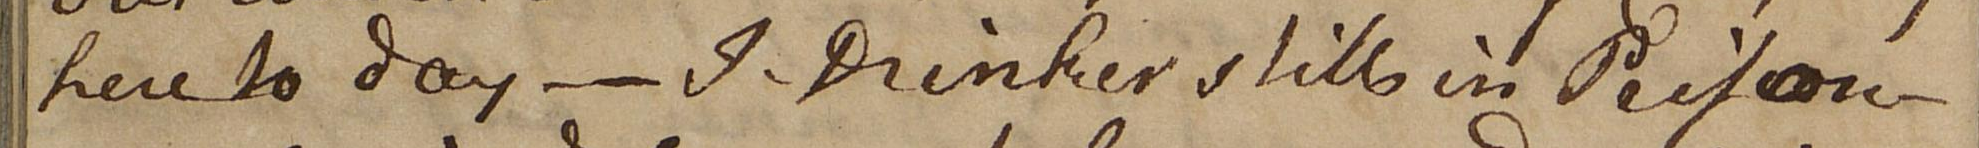here to day- I. Drinker still in Prison
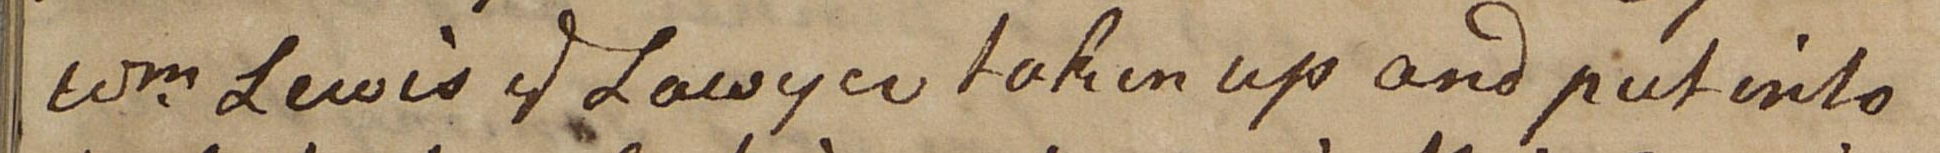W^m. Lewis y^e Lawyer taken up and put into
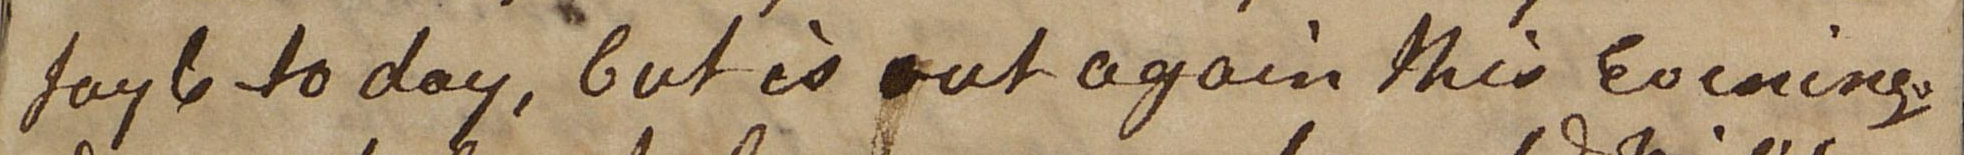jay 6 to day, but is out again this Evening,
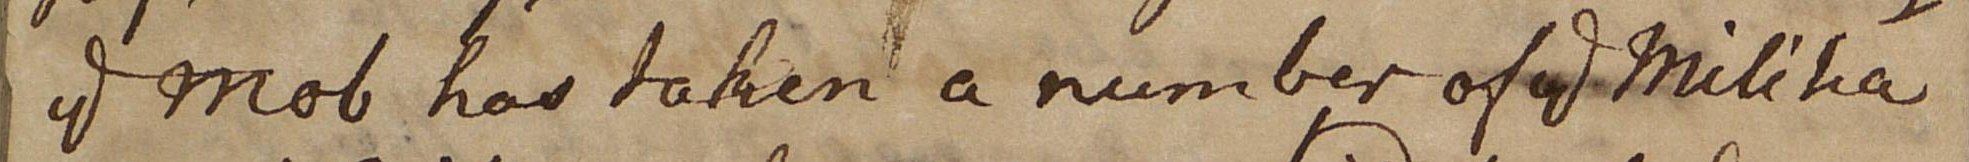y^e mob has taken a number of y^e Militia
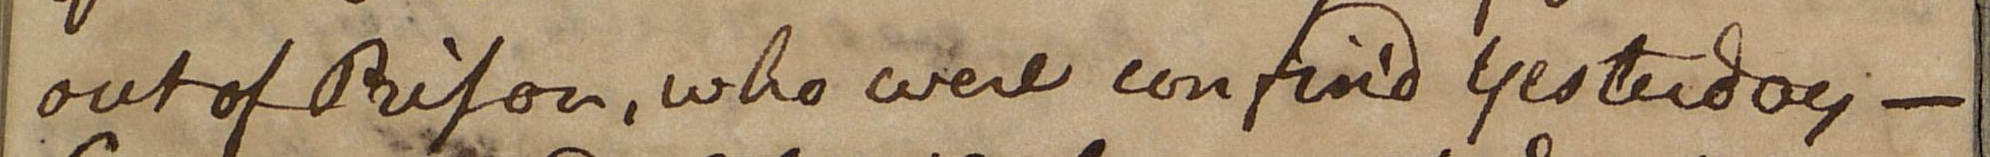out of Prison, who were confin'd yesterday-
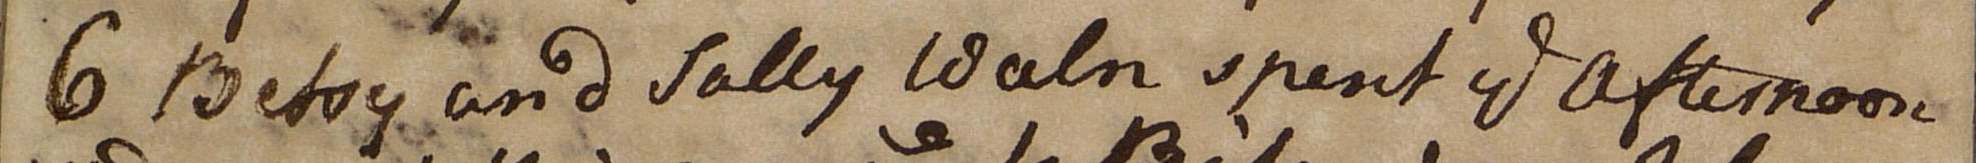6 Betsy and Sally Waln spent y^e Afternoon
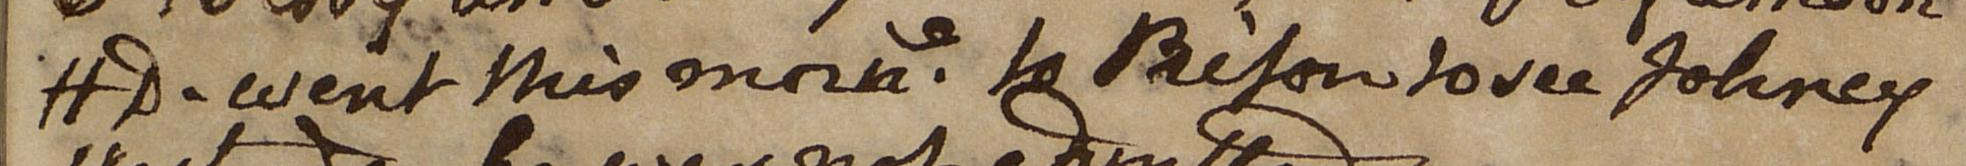HD- went this morn^g. to Prison to see Johney
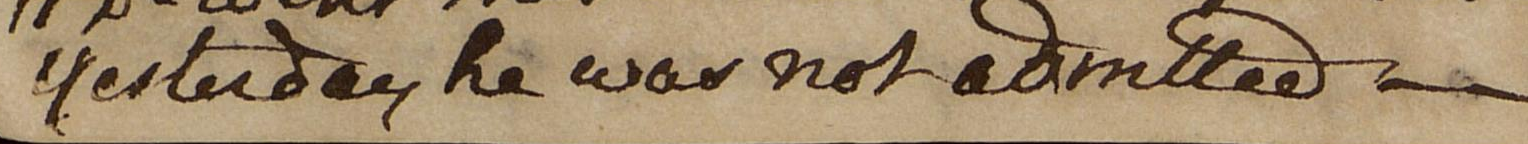Yesterday he was not admtted-
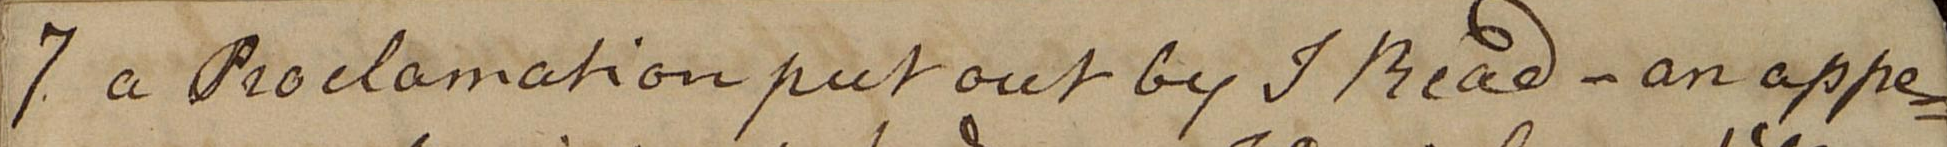7 a Proclamation put out by I Read- an appe-
